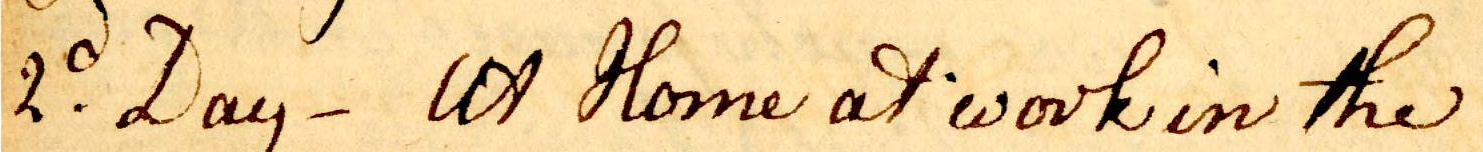2^d. Day- At Home at work in the
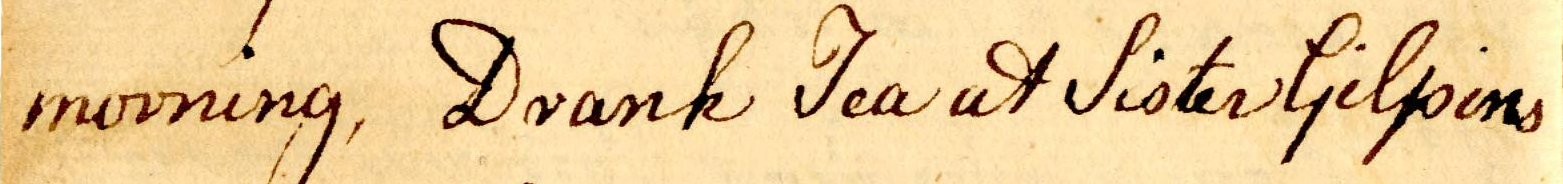morning, Drank Tea at Sister Gilpins
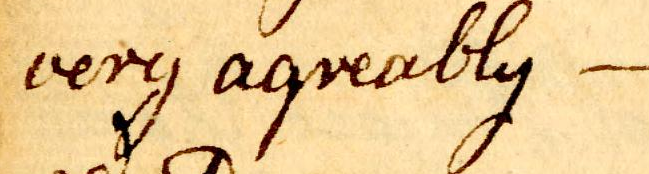very agreably
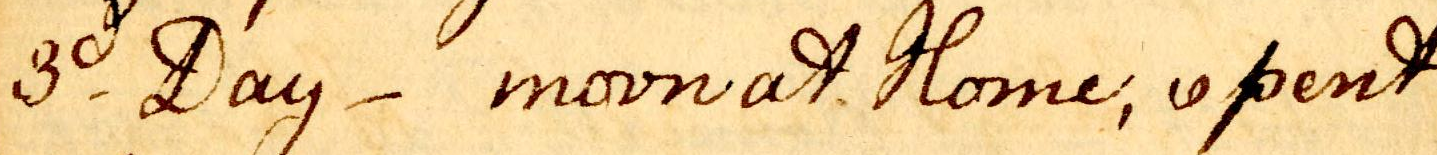3^d- Day- morn at Home, spent
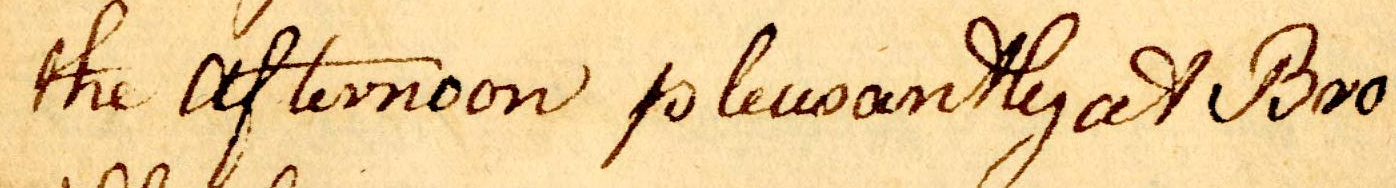the afternoon pleasantly at Bro'
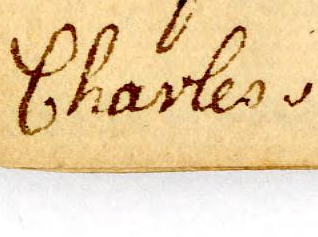Charles,
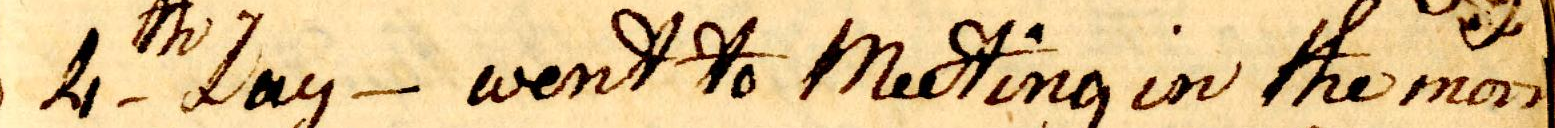4^th Day- went to Meeting in the morn
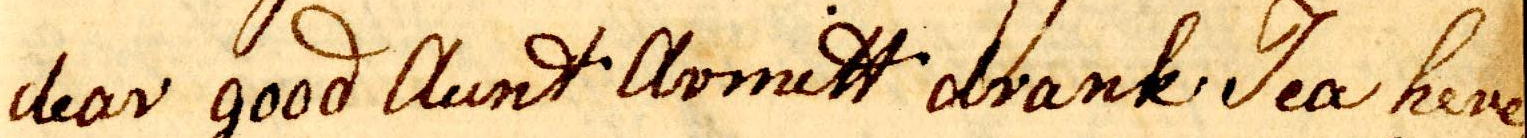dear good Aunt Armitt drank Tea here,
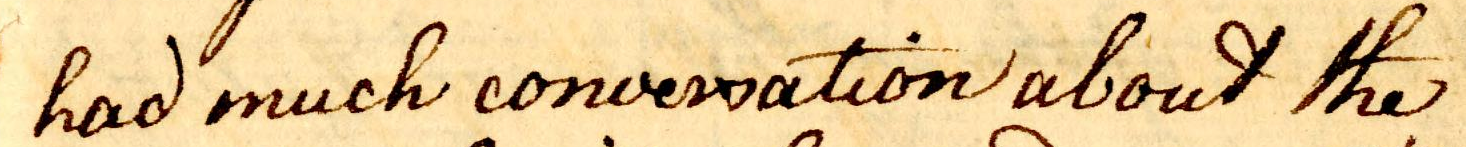had much conversation about the
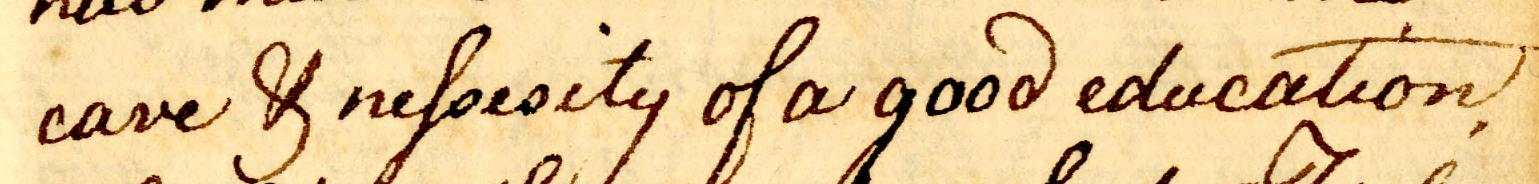care & nessesity of a good education,
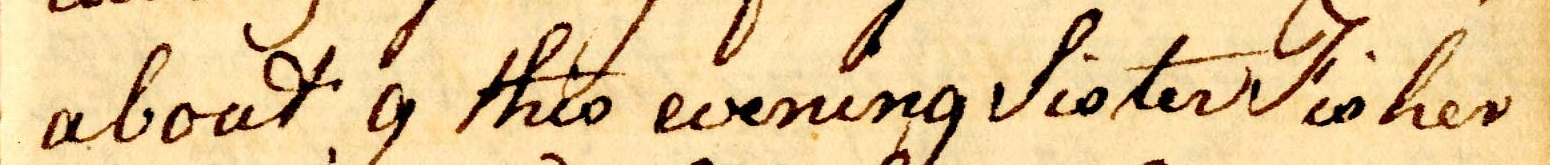about 9 this evening Sister Fisher
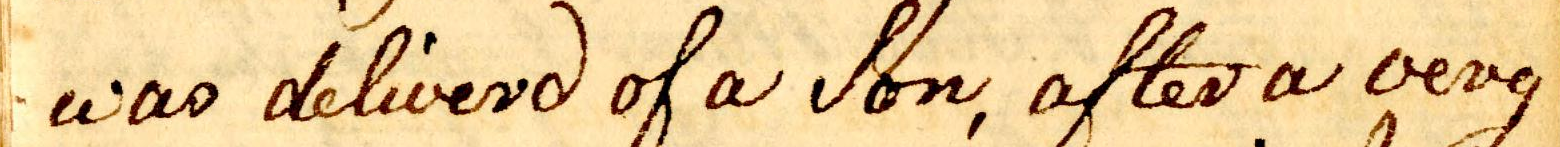was delivered of a Son, after a very
